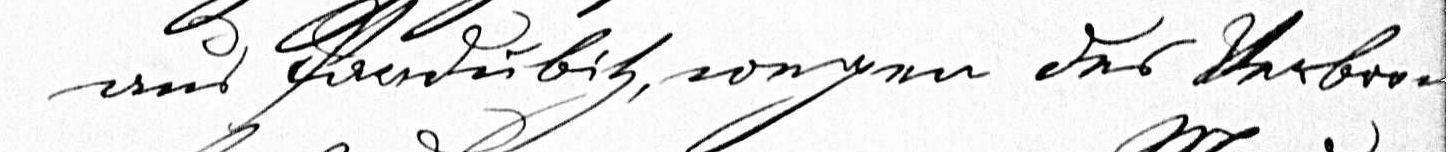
aus Paadubitz, wegen des Verbre¬
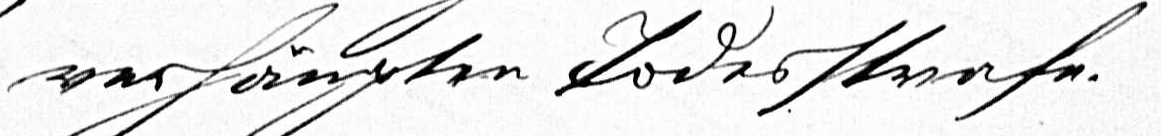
verhängten Todesstrafe.
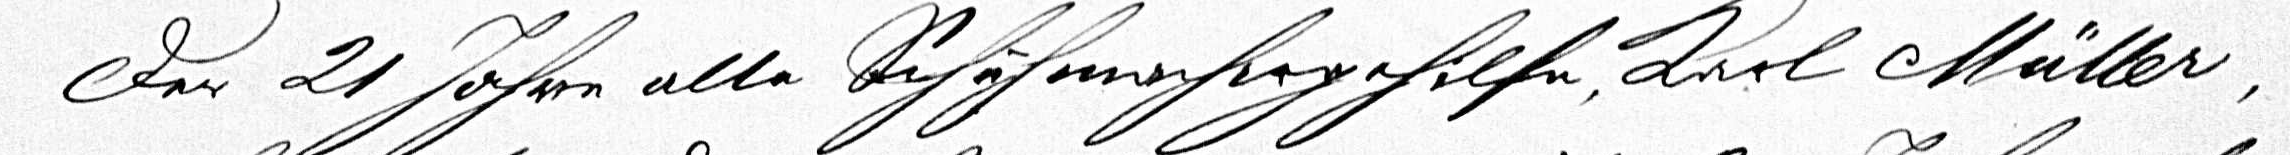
Der 21 Jahre alle Schuhmachergehilfe, Karl Müller,
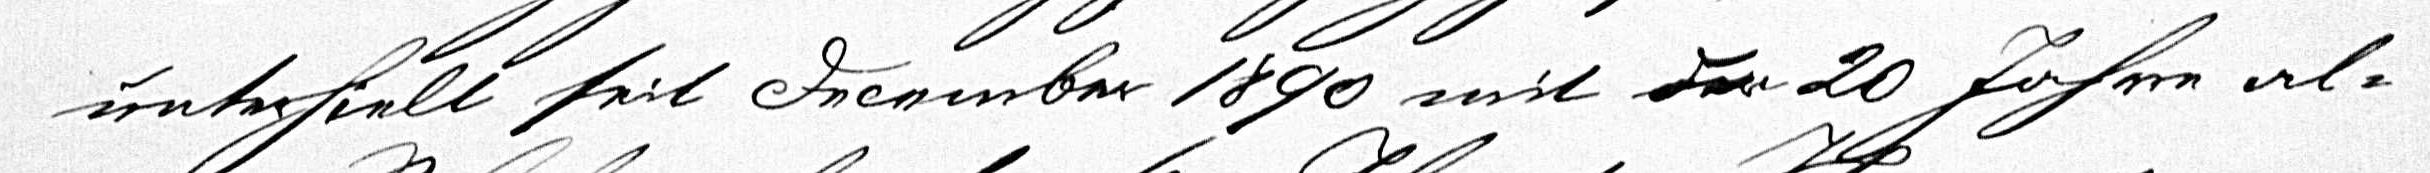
unterhielt seit December 1890 mit der 20 Jahre al¬
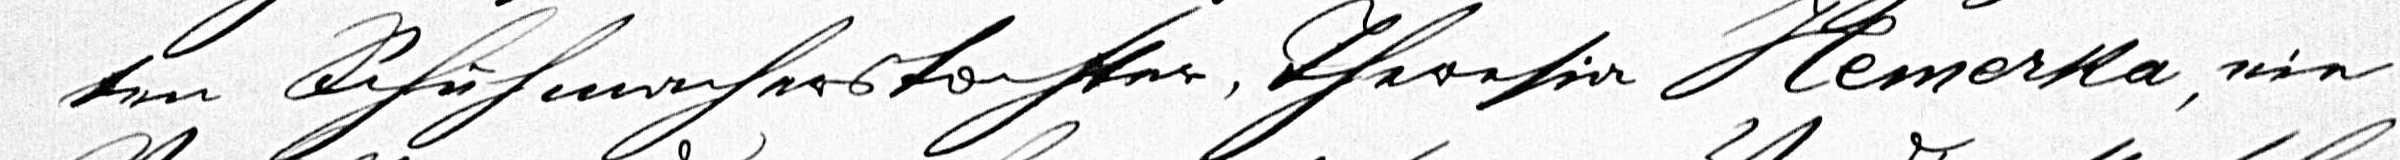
ten Schuhmacherstochter, Theresia Hemerka, ein
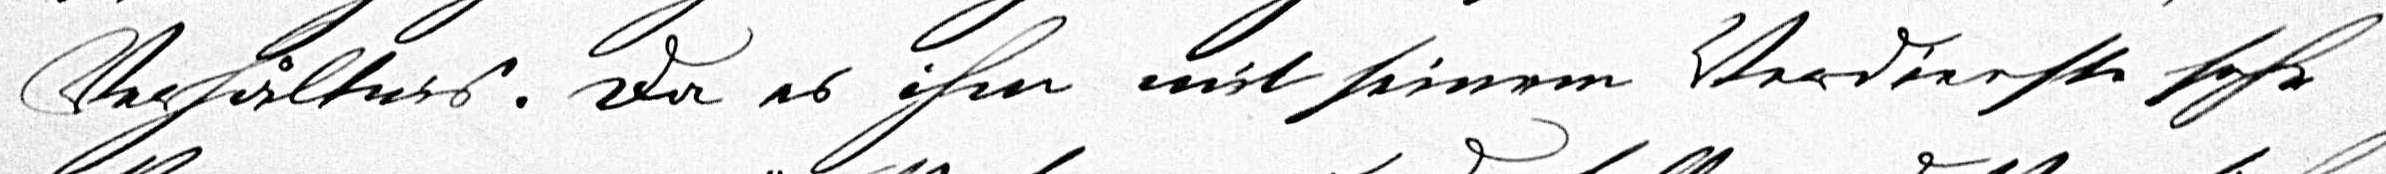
Verhältnis. Da es ihm mit seinem Verdienste sehr
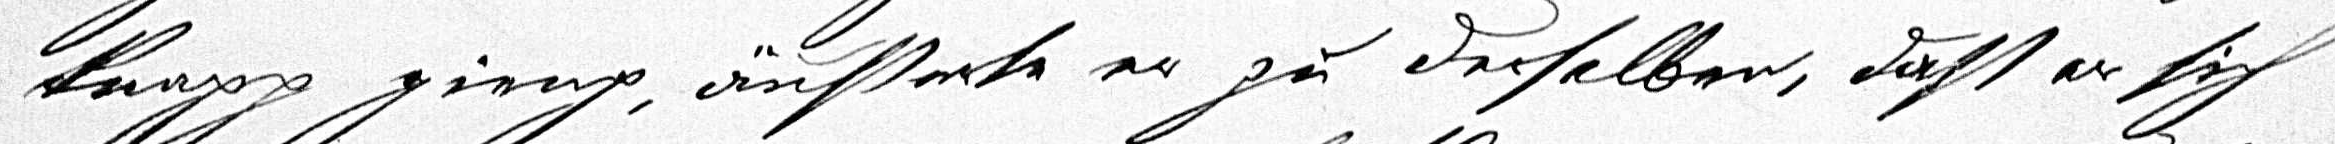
knapp gieng, äußerte er zu derselben, daß er sich
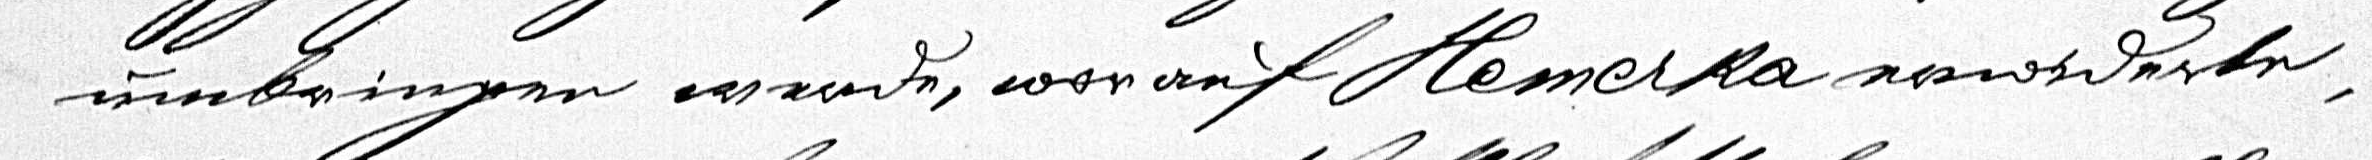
umbringen werde, worauf Hemerka erwiderte,
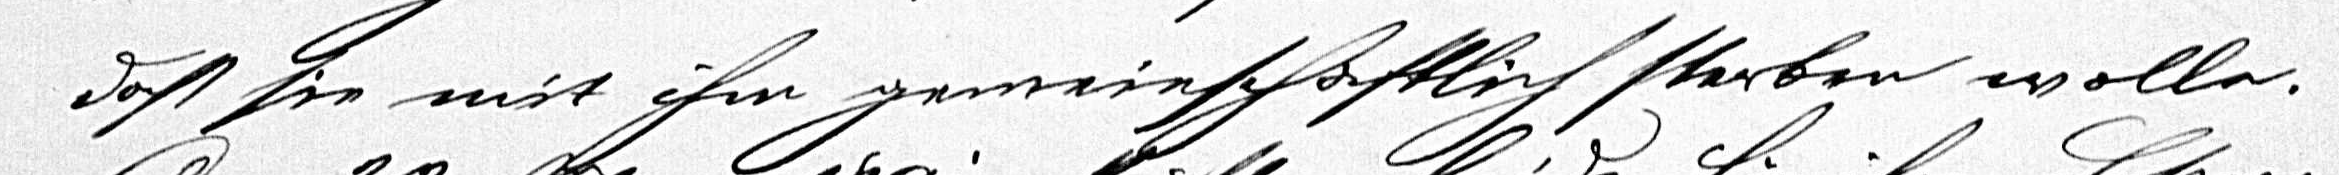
daß sie mit ihm gemeinschaftlich sterben wolle.
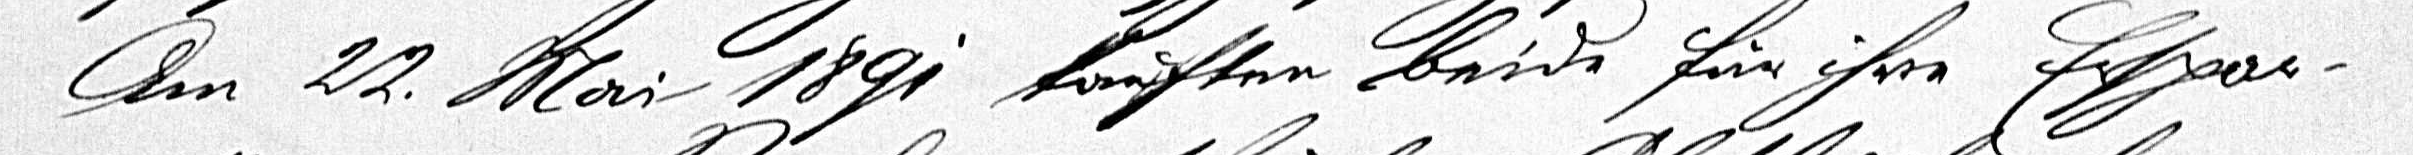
Am 22. Mai 1891 kauften beide für ihre Espar¬
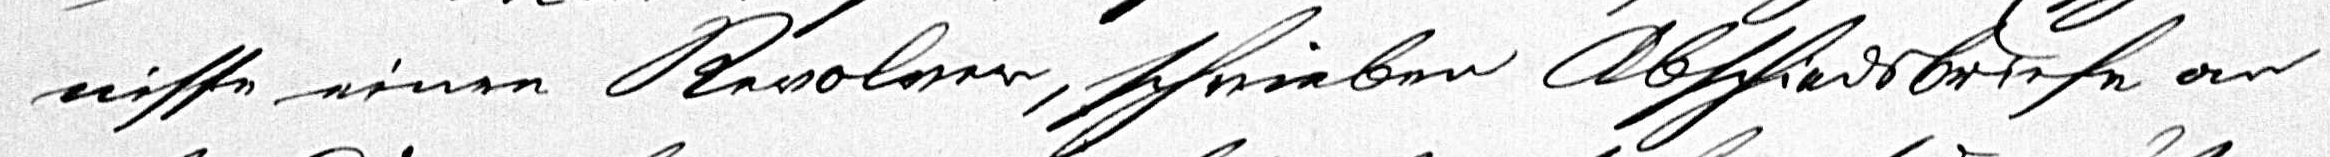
nisse einen Revolver, schrieben Abschiedsbriefe an
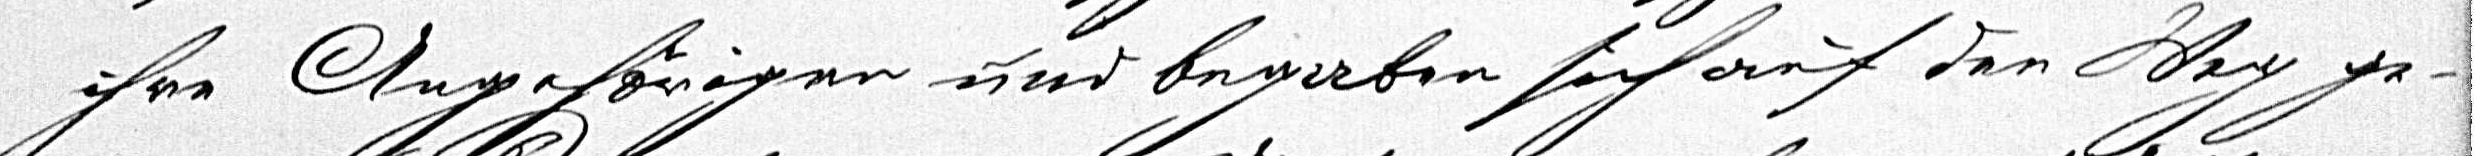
ihre Angehörigen und begaben sich auf den Weg ge¬
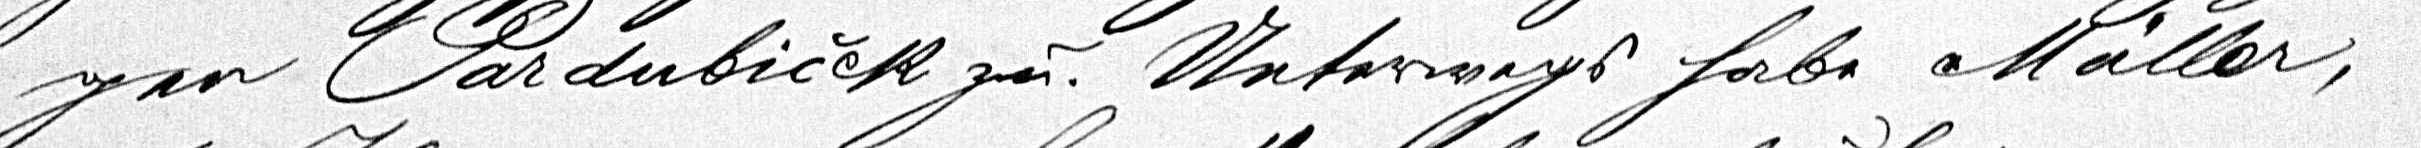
gen Pardubiček zu. Unterwegs habe Müller,
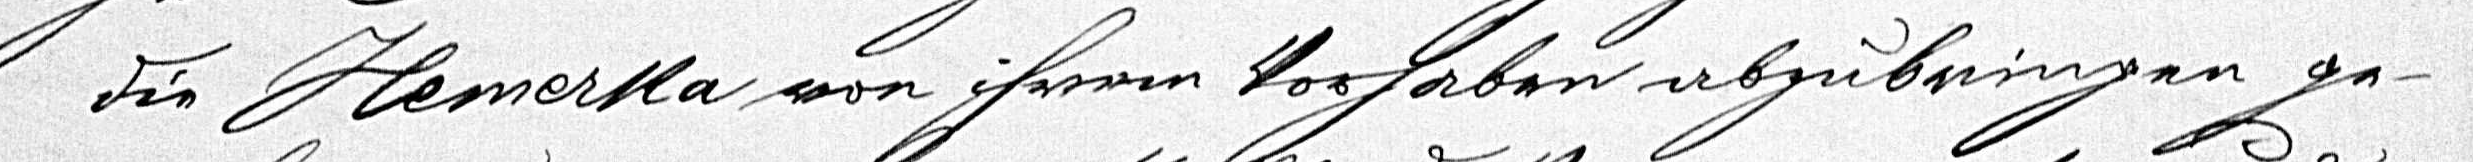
die Hemerka von ihrem Vorhaben abzubringen ge¬
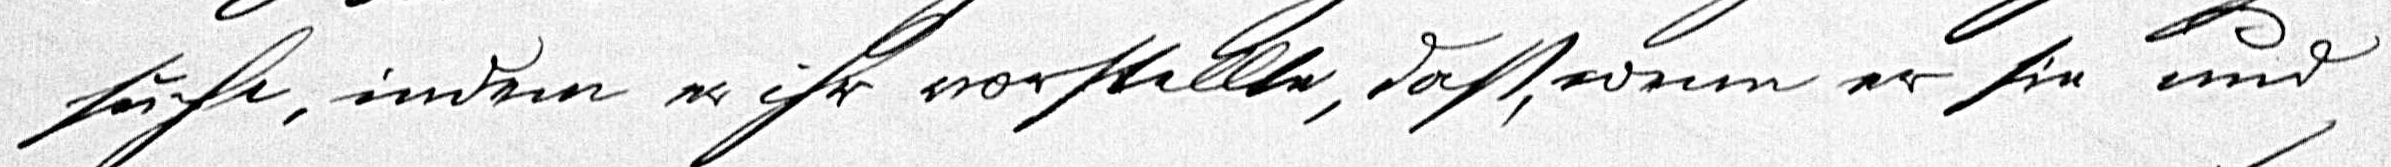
sucht, indem er ihr vorstellte, daß wenn er sie und
